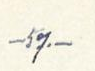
57
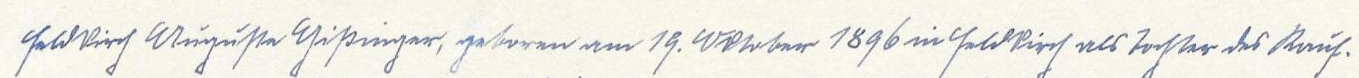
Feldkirch Augusta Gißsinger, geboren am 19. Oktober 1896 in Feldkirch als Tochter des Kauf-
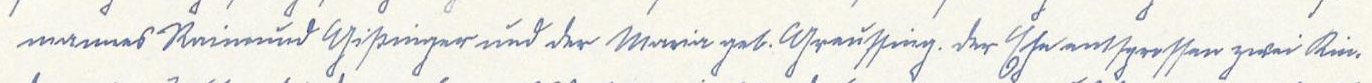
mannes Raimund Gißinger und der Maria geb. Greussing. Der Ehe entsprossen zwei Kin-
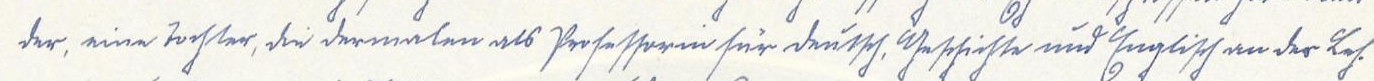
eine Tochter, die dermalen als Professorin für Deutsch, Geschichte und Englisch an der Leh
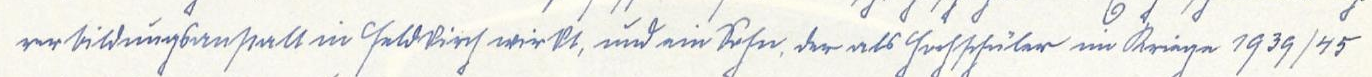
rerbildungsanstalt in Feldkirch wirkt, und einen Sohn, der als Hochschüler im Kriege 1939/45
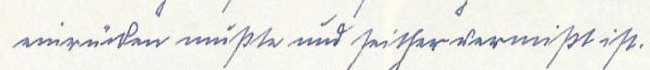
einrücken musste und seither vermisst ist.
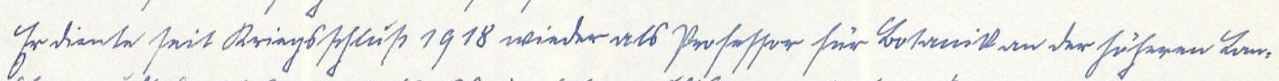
Er diente seit Kriegsschluss 1918 wieder als Professor für Botanik an der höheren Lan-
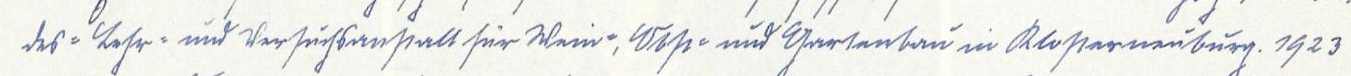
des-Lehr- und Versuchsanstalt für Wein-, Obst- und Gartenbau in Klosterneuburg. 1923
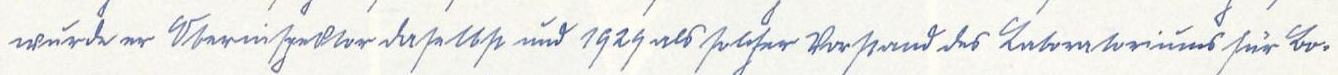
wurde er Oberinspektor daselbst und 1929 als solcher Vorstand des Laboratoriums für Bo-
